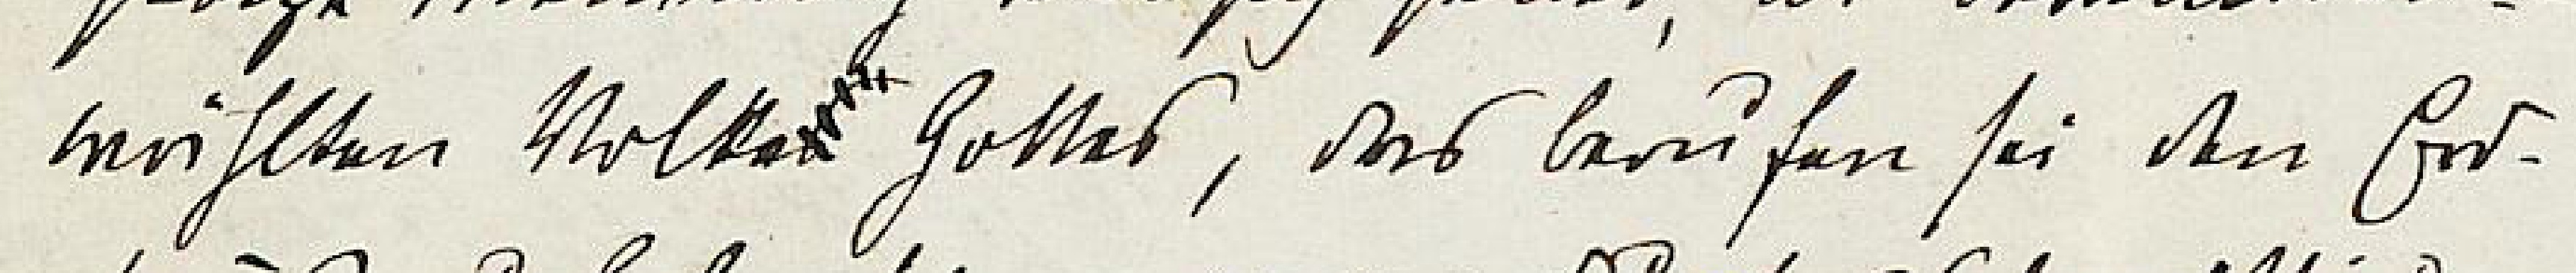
wählten Volkes Gottes, das berufen sei den Erd¬
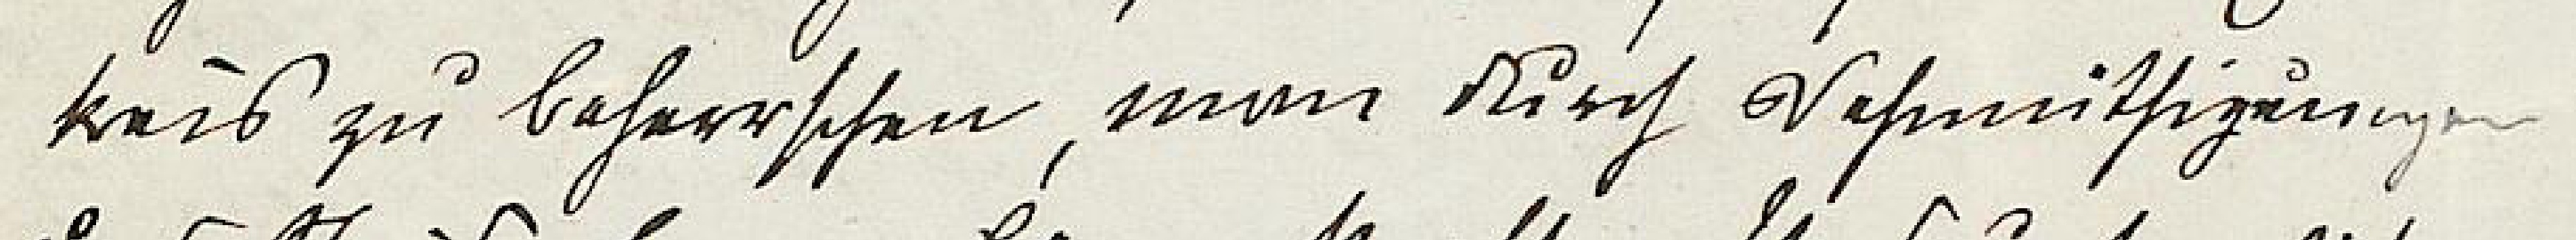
kreis zu beherrschen, man durch Dehmüthigungen
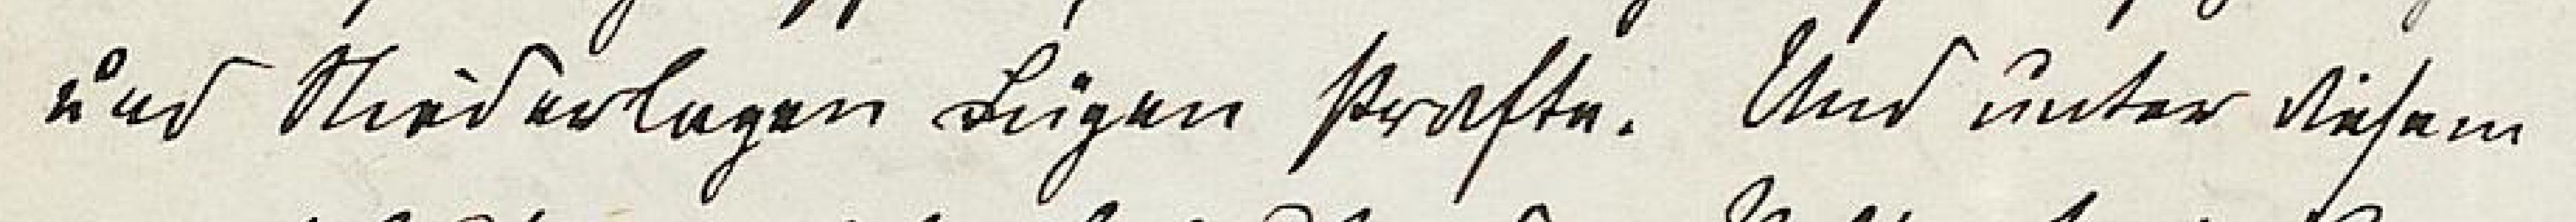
und Niederlagen Lügen stragte. Und unter diesem
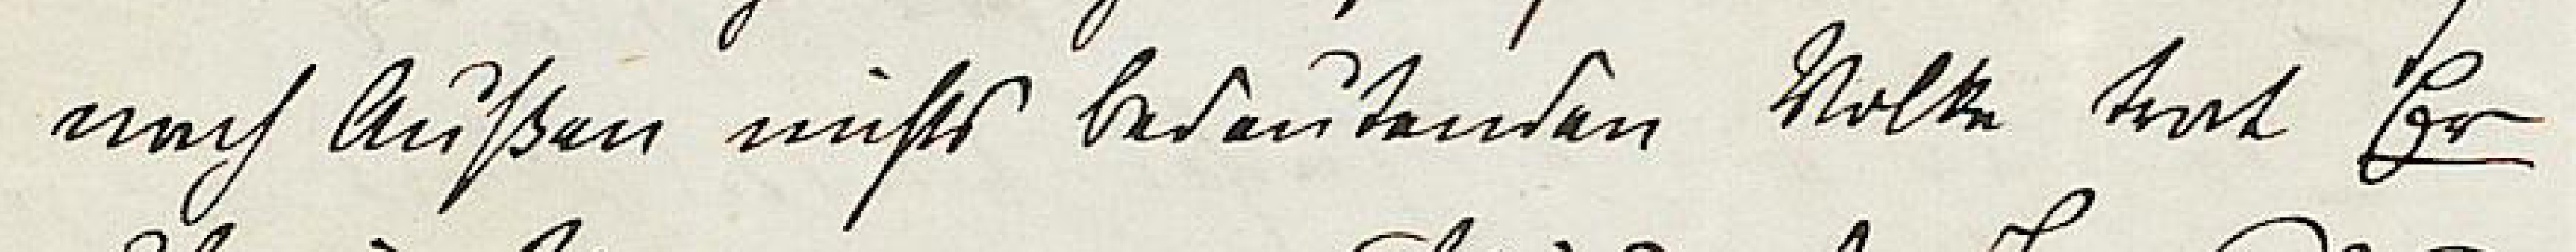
nach Außen nichts bedeutenden Volk trat Er
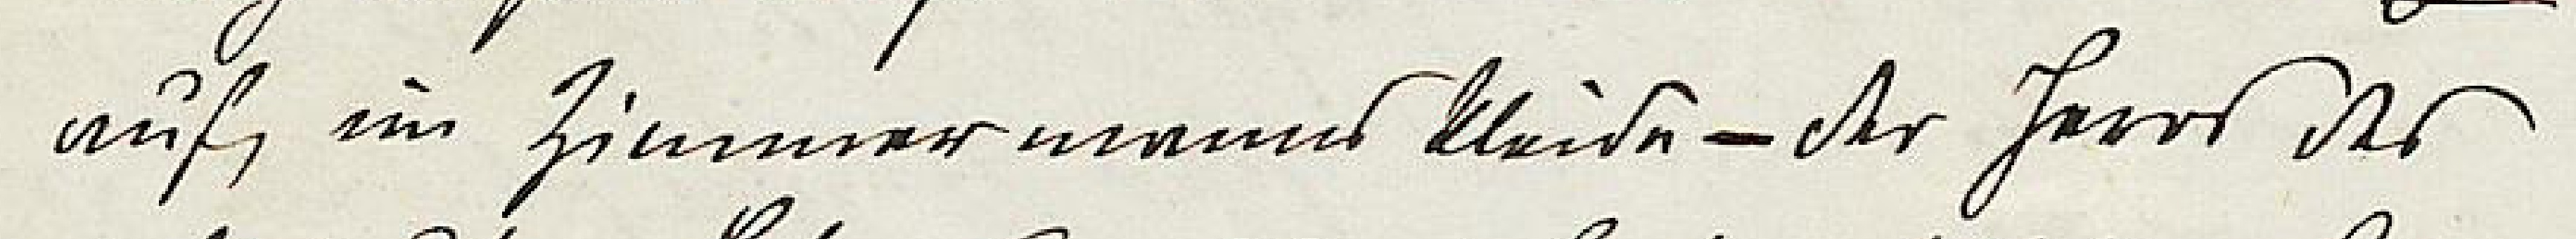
auf, im Zimmermannskleide _ der Herr des
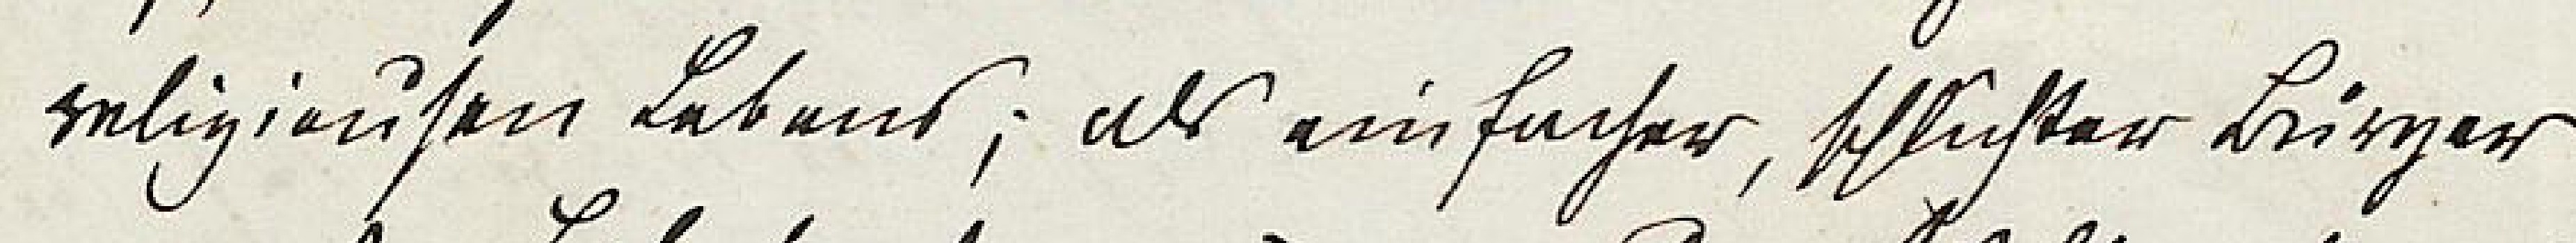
religieusen Lebens; als einfacher, schlichter Bürger
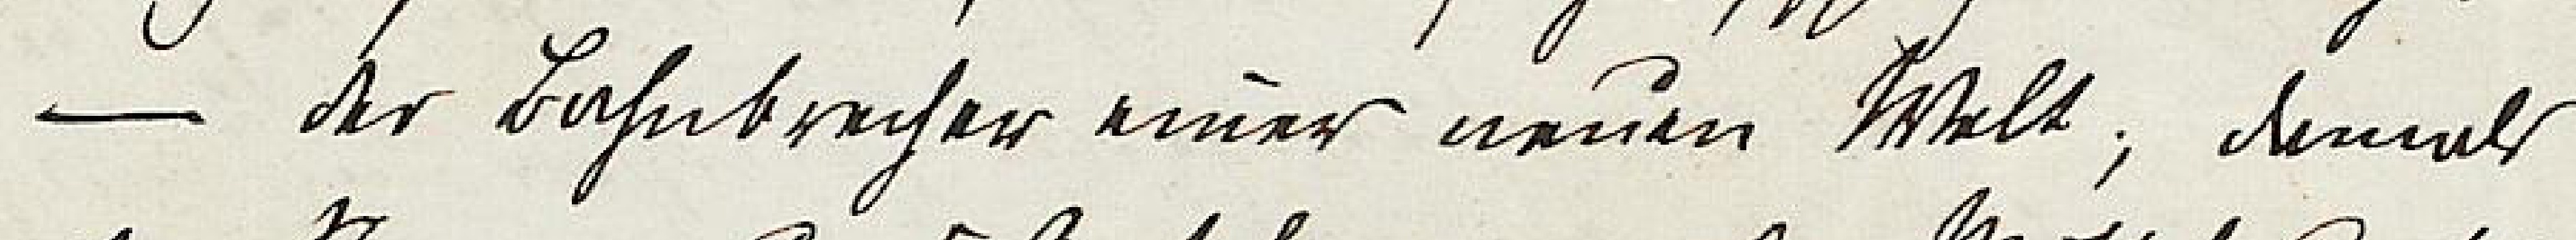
_ der Bahnbrecher einer neuen Welt, damals
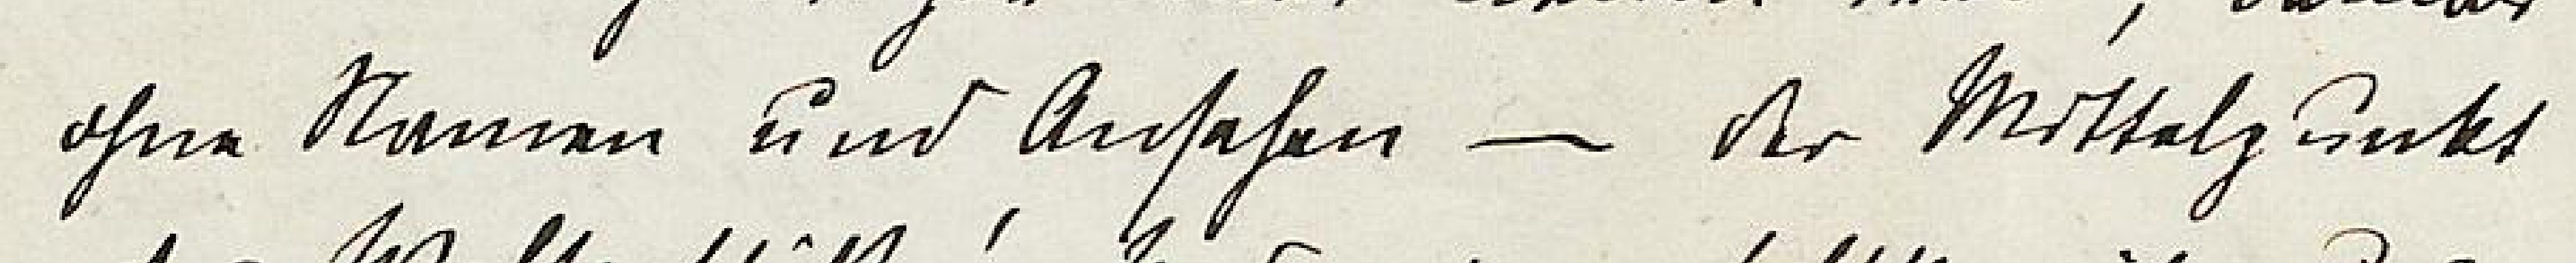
ohne Namen und Ansehen _ der Mittelpunkt
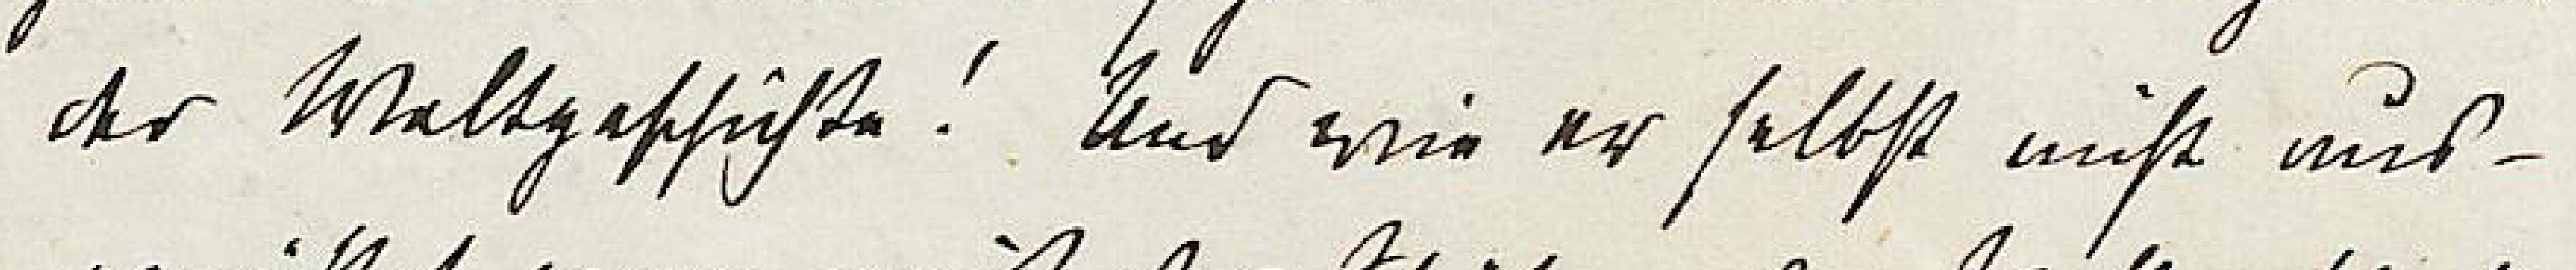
der Weltgeschichte! Und wie er selbst nicht aus¬
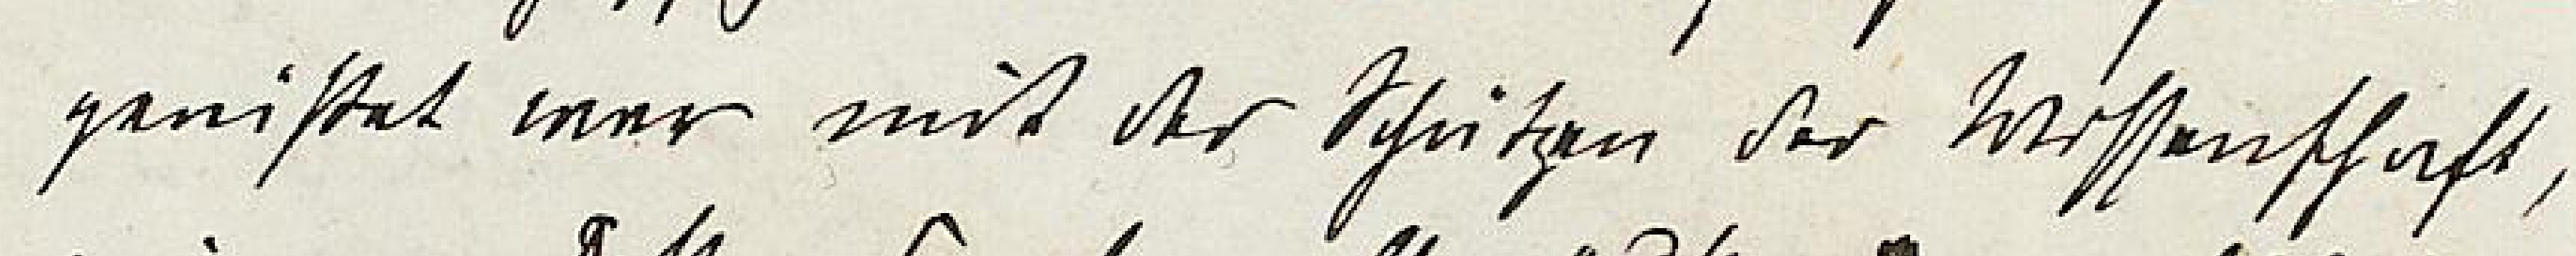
gerüstet war mit den Schätzen der Wissenschaft,
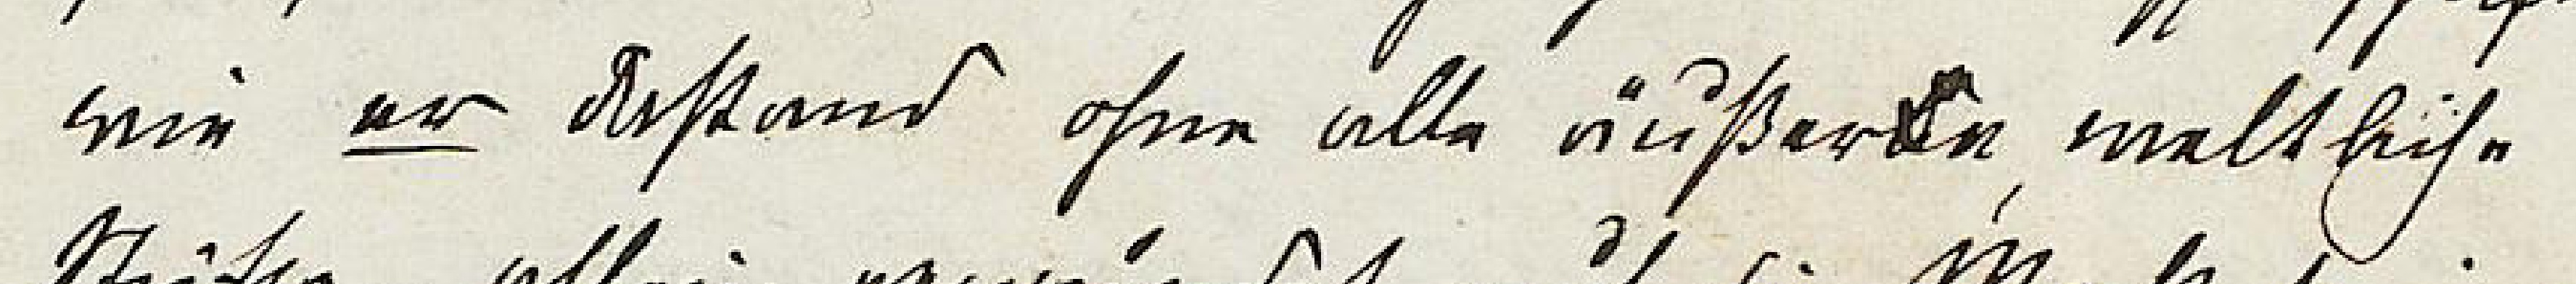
wie er dastand ohne alte äußere weltliche
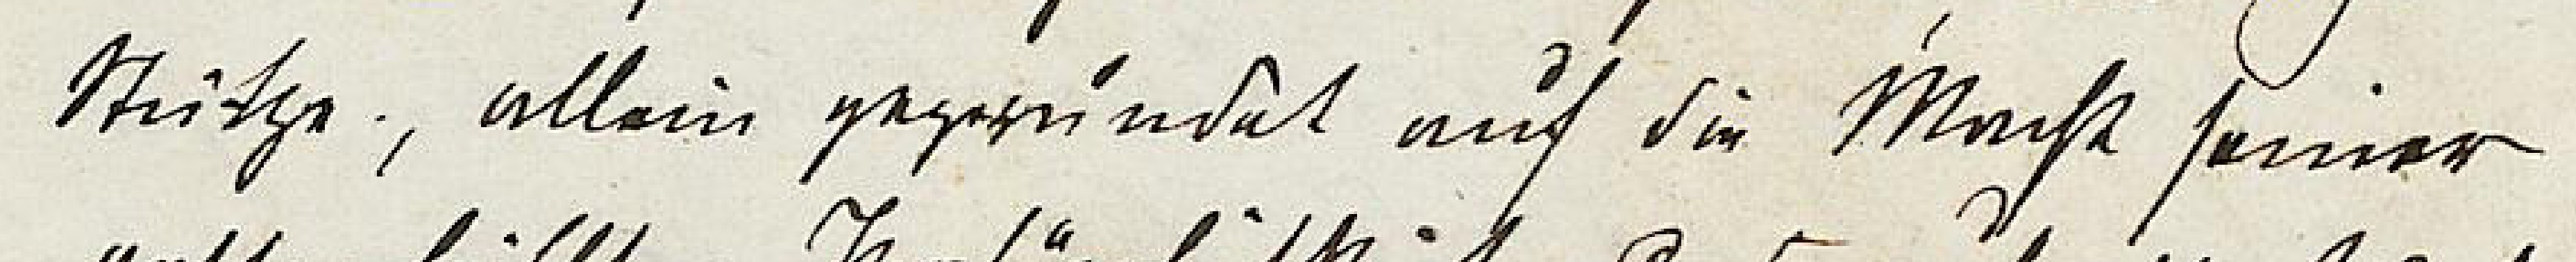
Stütze, allein gegründet auf die Macht seiner
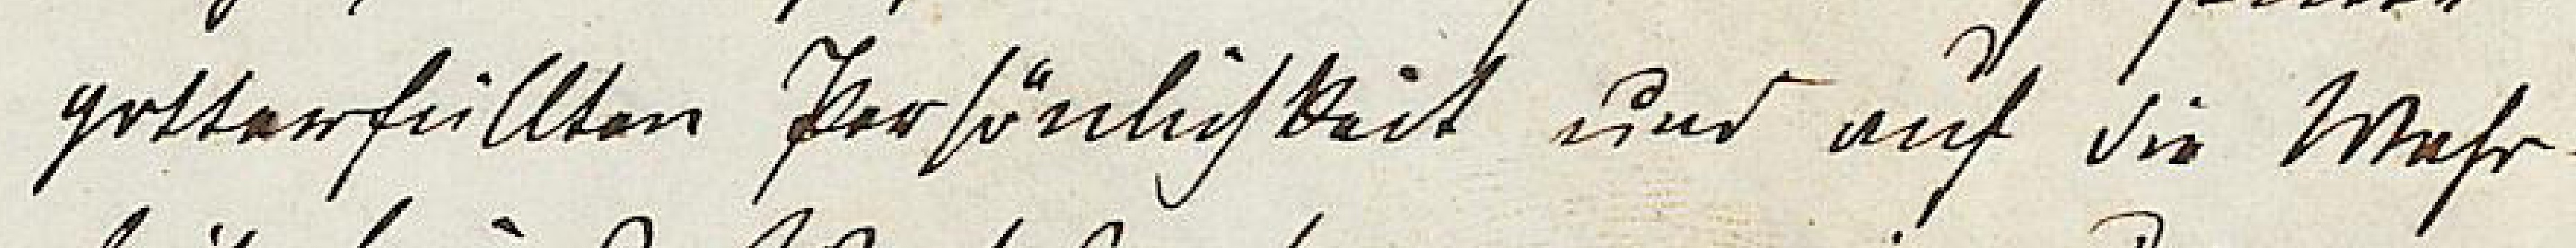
gotterfüllten Persönlichkeit und auf die Wahr¬
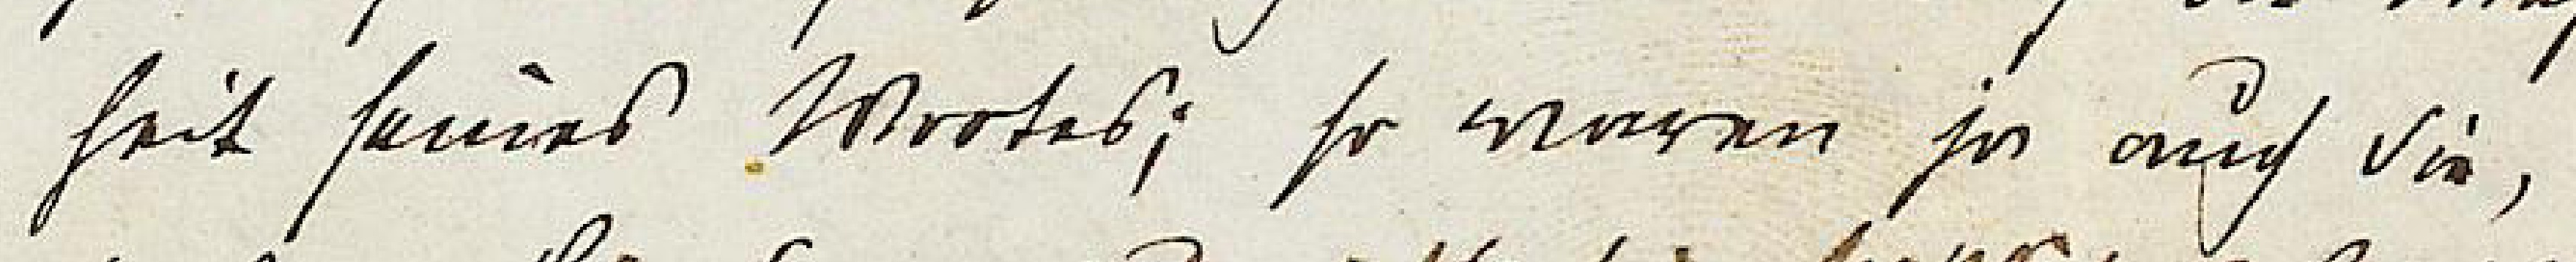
heit seines Wortes; so waren ja auch die,
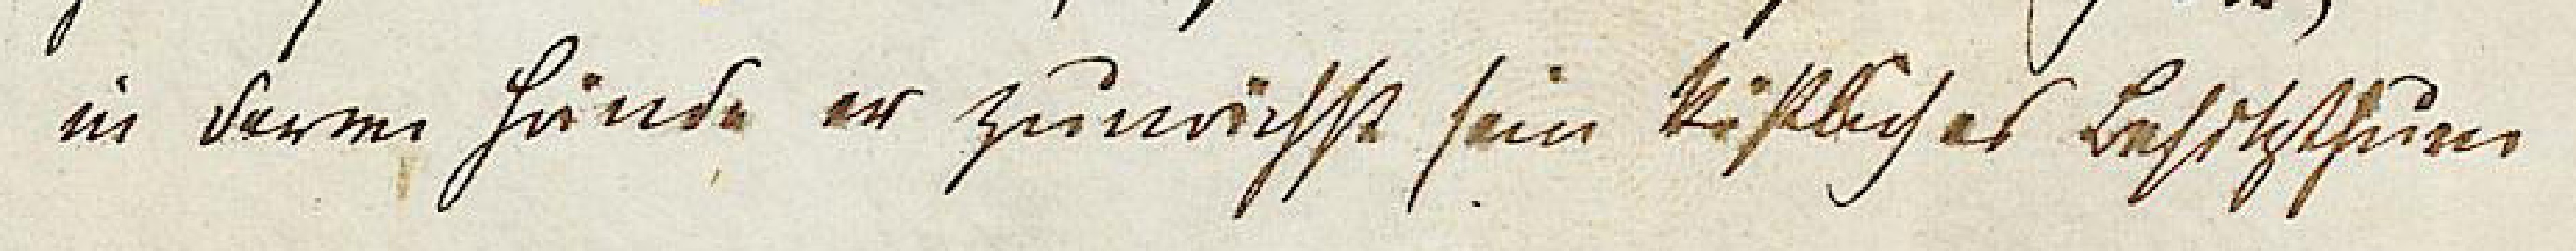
in deren Hände er zunächst sein köstliches Besitzthum
